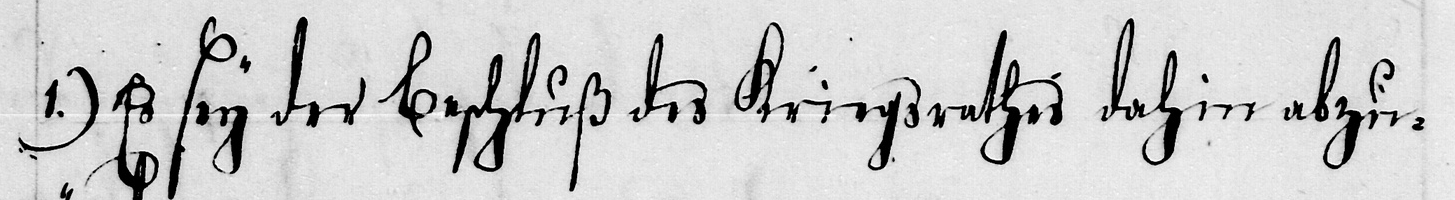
1.) Es sey der Beschluß des Kriegsrathes dahin abzu¬
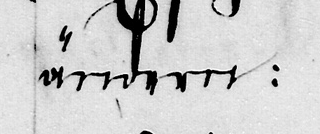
ändern:
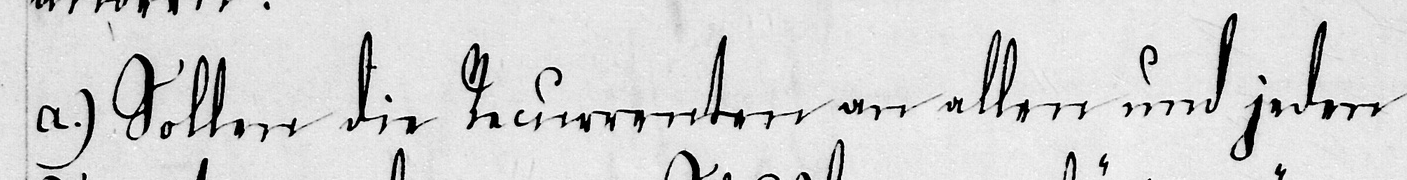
a.) Sollen die Recurrenten an allen und jeden
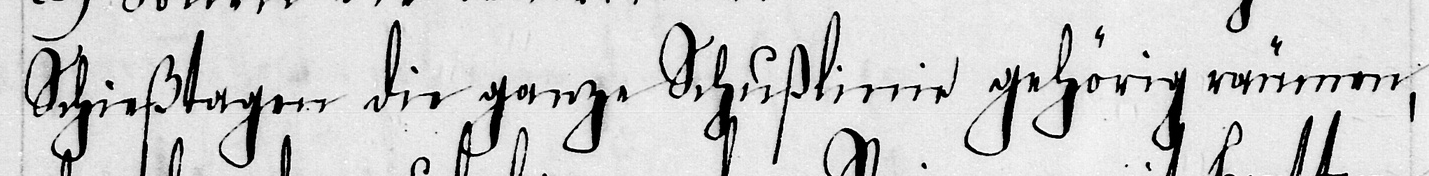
Schießtagen die ganze Schußlinie gehörig räumen,
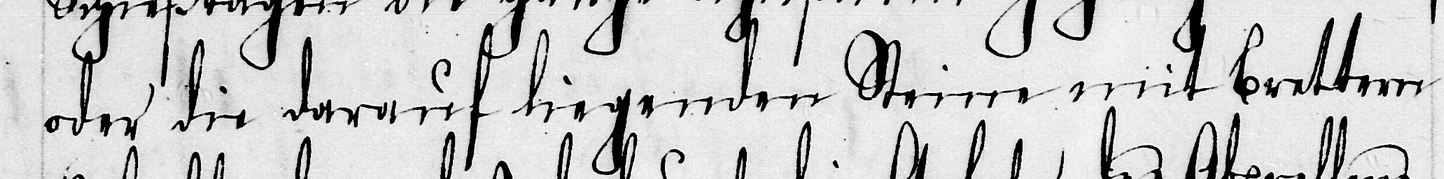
oder die darauf liegenden Steine mit Brettern
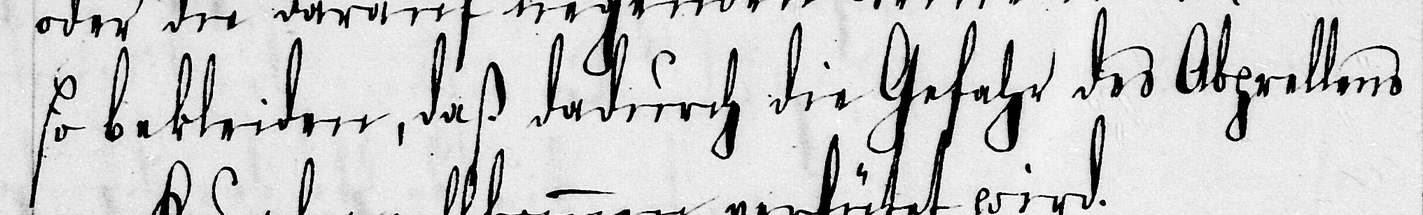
so bekleiden, daß dadurch die Gefahr des Abprellens
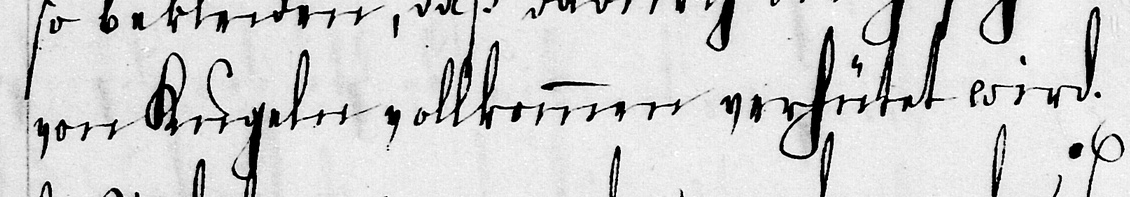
von Kugeln vollkommen verhütet wird.
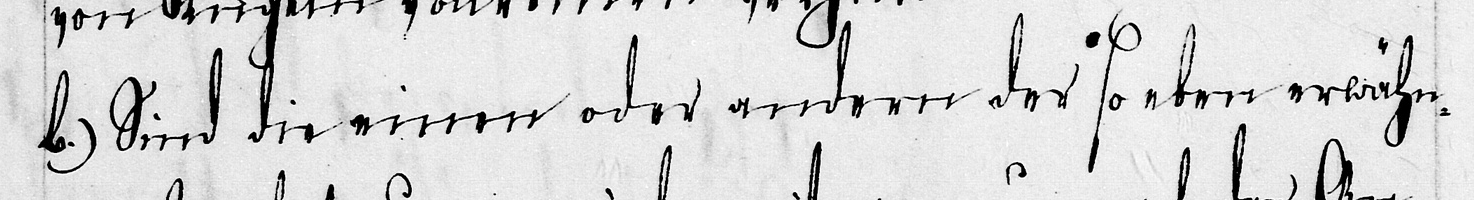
b.) Sind die einen oder andern der so eben erwähn¬
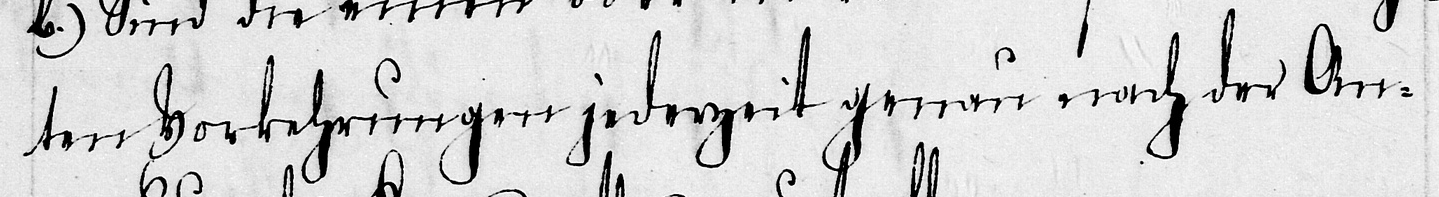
ten Vorkehrungen jederzeit genau nach der An¬
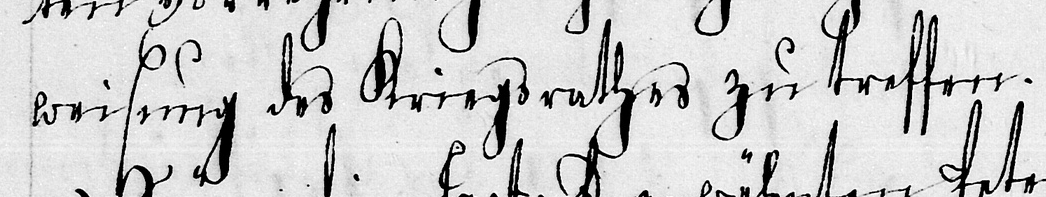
weisung des Kriegsrathes zu treffen:
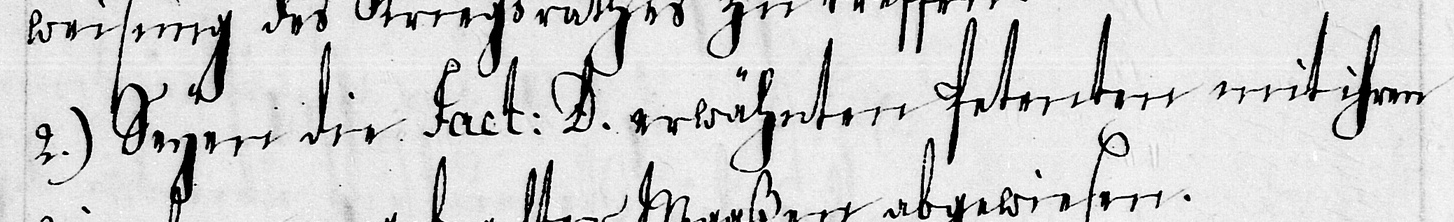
2.) Seyen die Fact: D. erwähnten Petenten mit ihren
